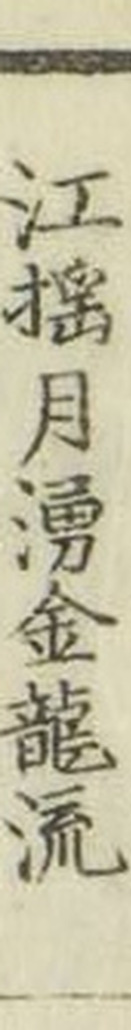江揺月湧金竜流
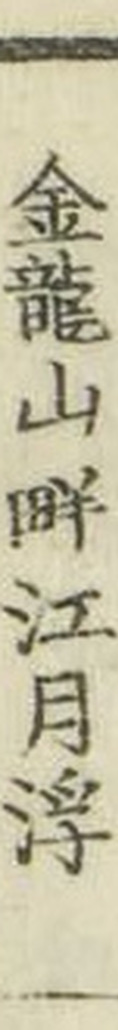金竜山畔江月浮
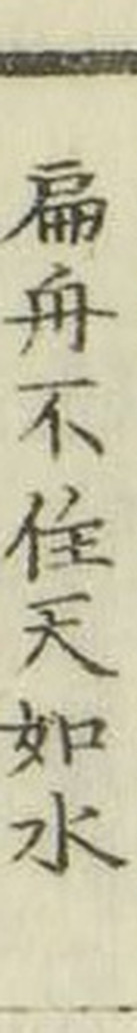扁舟不住天如水
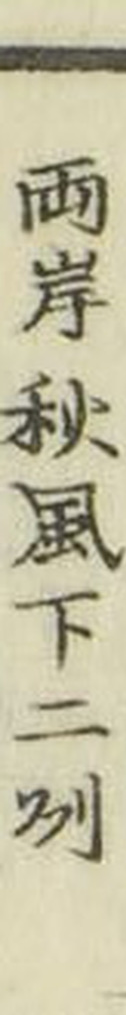両岸秋風下二州

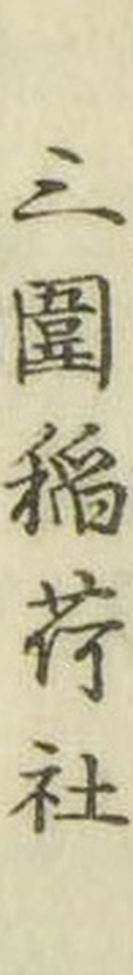三囲稲荷社
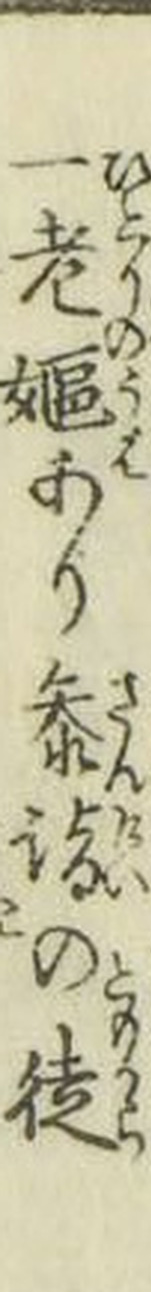一老嫗あり参詣の徒
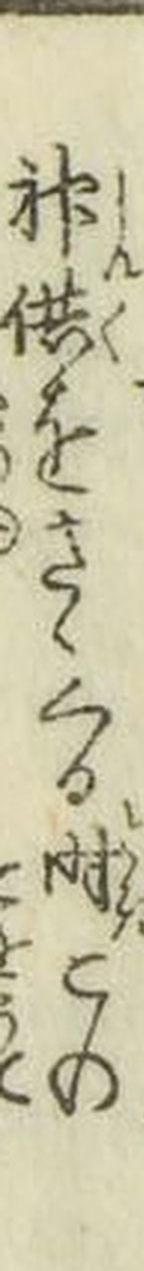神供をさゝくる時この
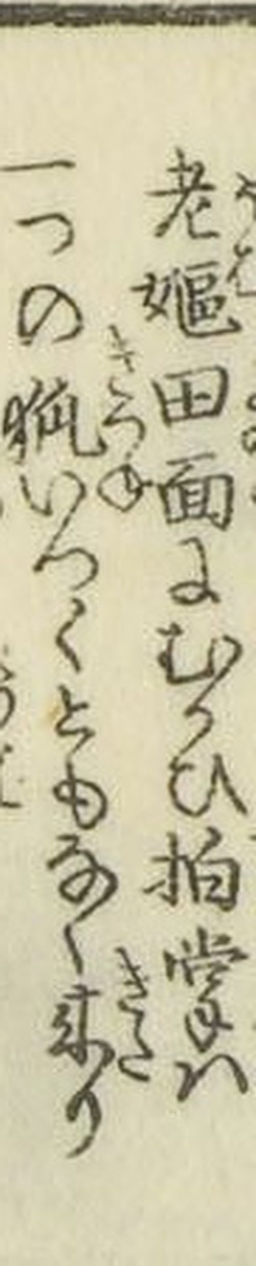一つの狐いつくともなく来り
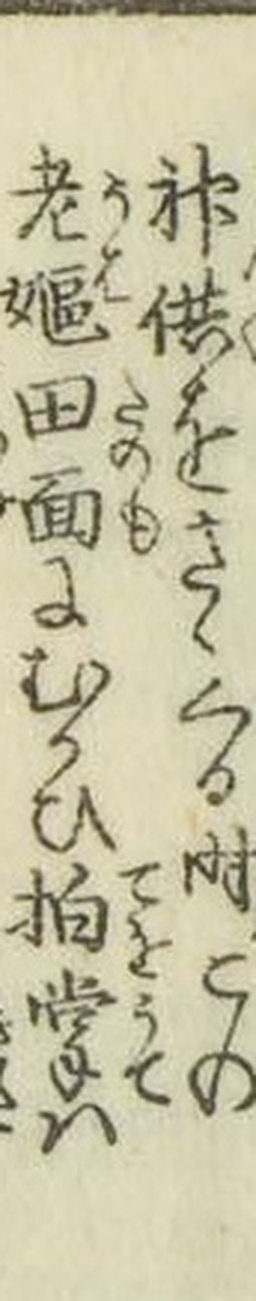老嫗田面にむかひ柏掌は
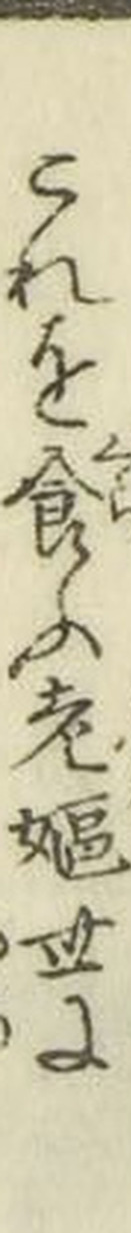これを食ふ老嫗世に
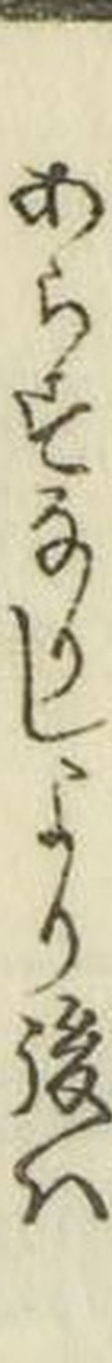あらすなりしより後
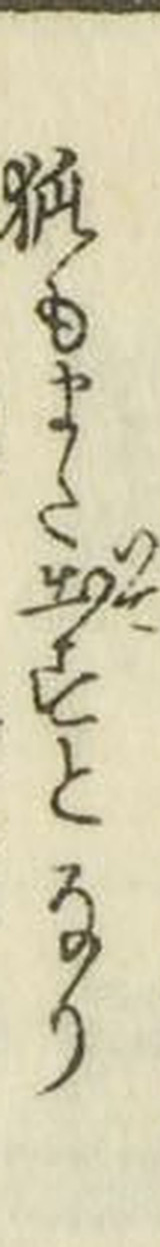狐もまた出すおなり
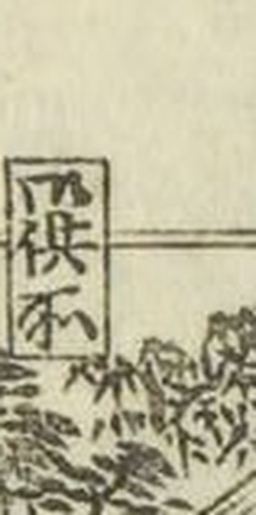御供所
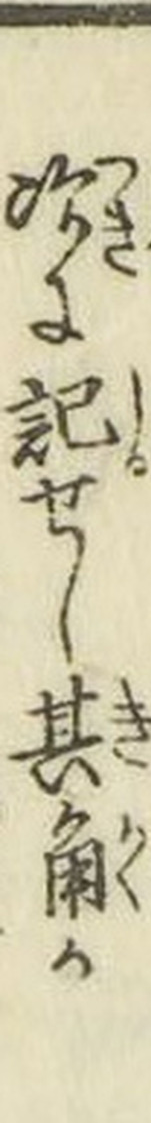次に記せし其角か
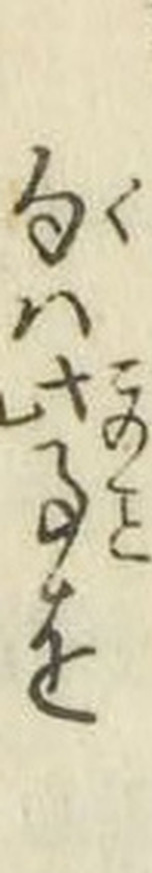句は此事を
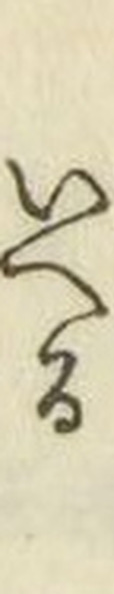いへる
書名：江戸名所図会 20巻 巻之19
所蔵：東京学芸大学教育コンテンツアーカイブ
